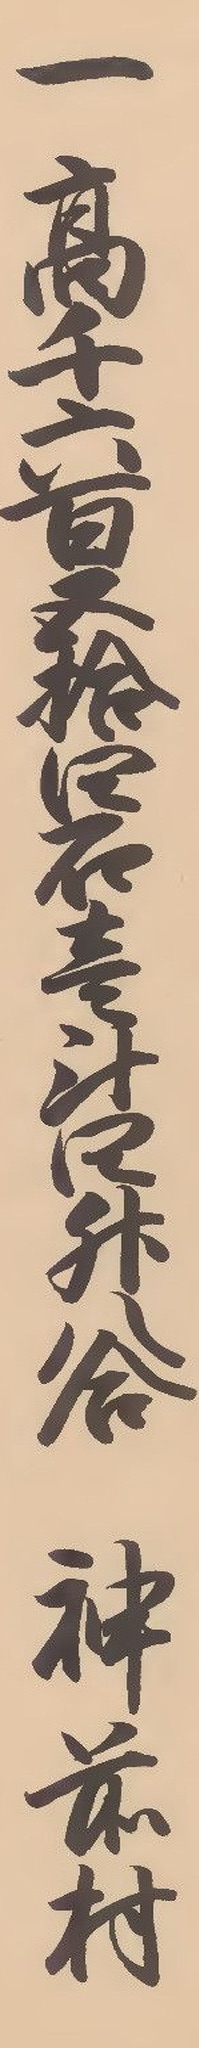一高千六百五拾四石壱斗四升八合神前村
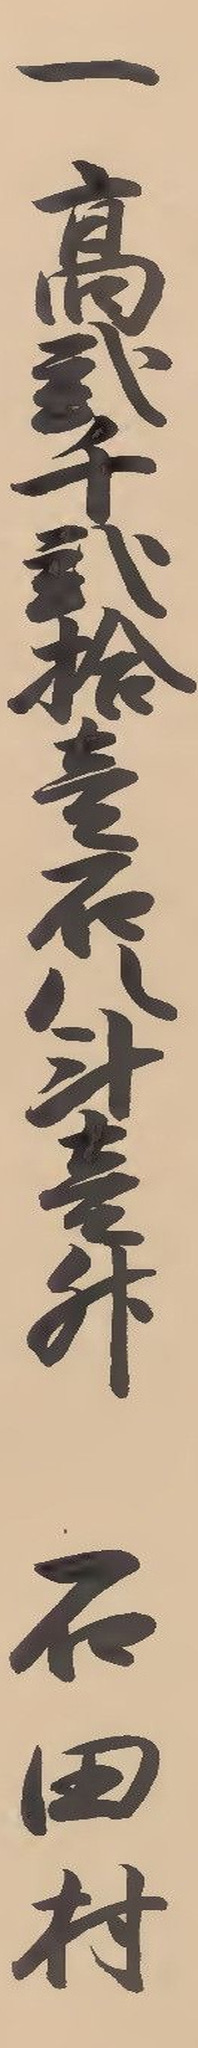一高弐千弐拾壱石八斗壱升石田村
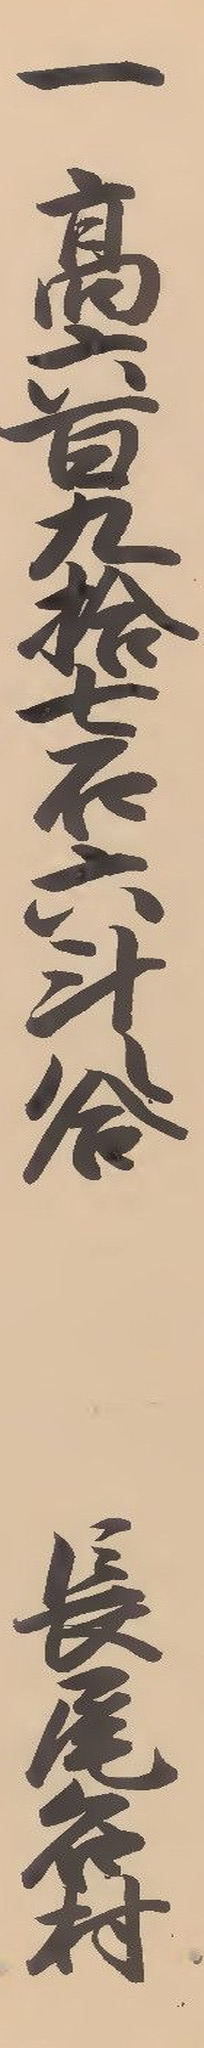一高六百九拾七石六斗八合長尾名村
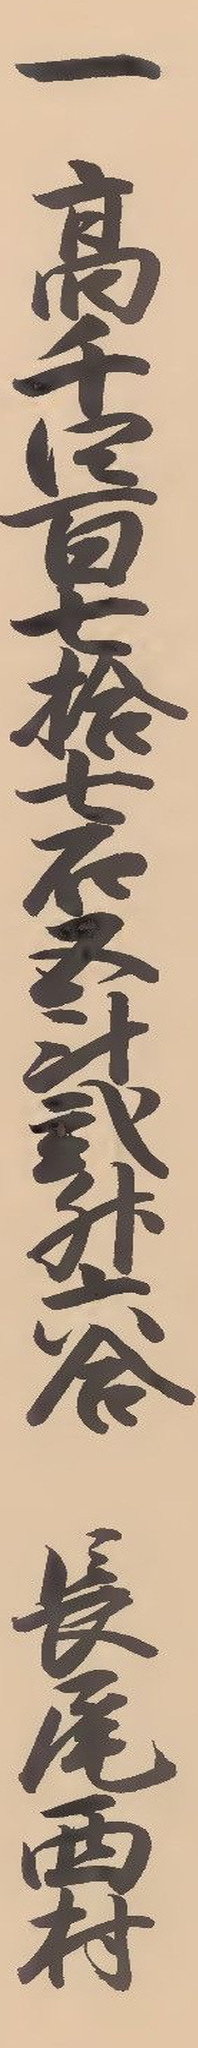一高千四百七拾七石五斗弐升六合長尾西村
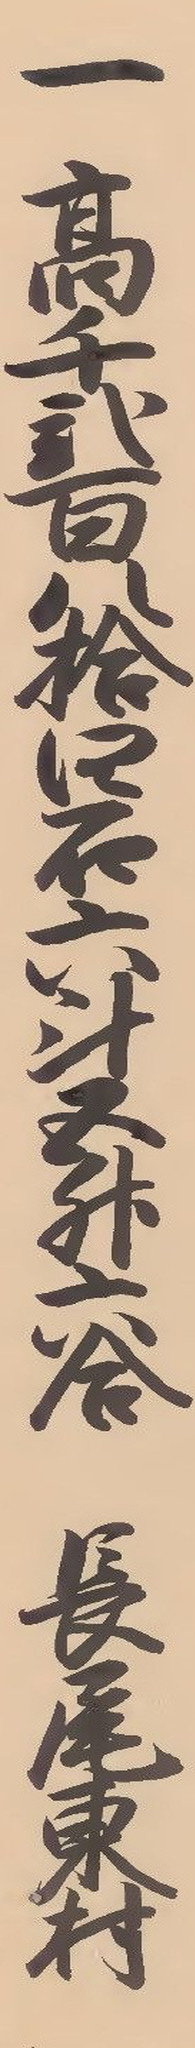一高千弐百八拾四石六斗五升六合長尾東村

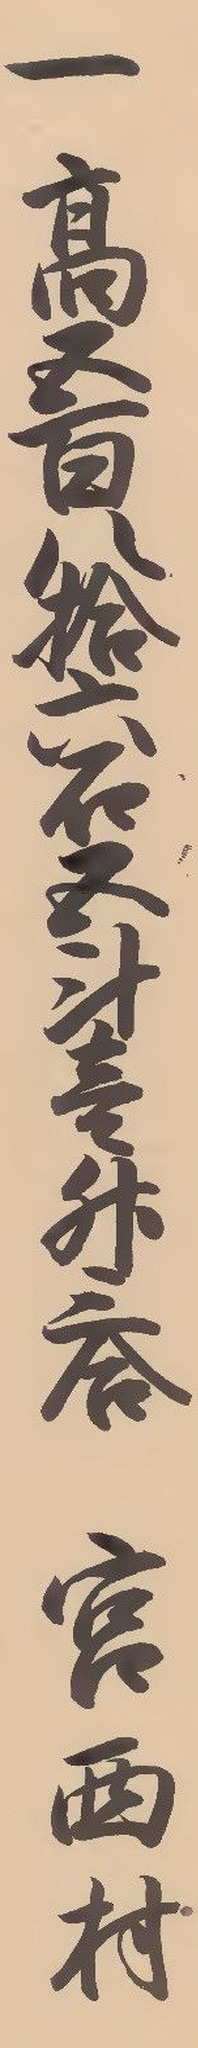一高五百八拾六石五斗壱升三合宮西村
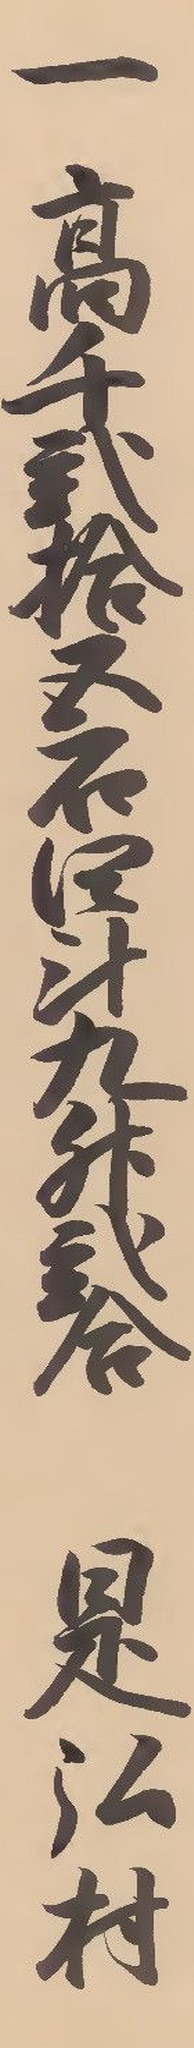一高千弐拾五石四斗九升弐合是弘村
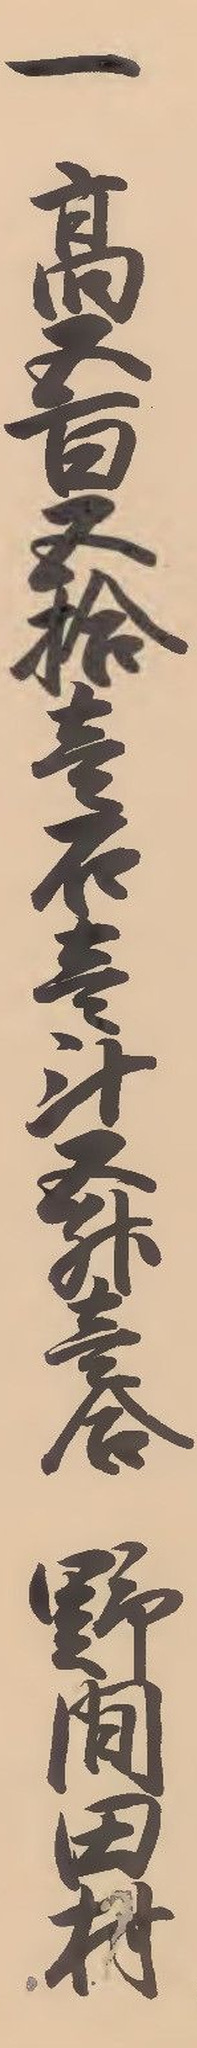一高五百五拾壱石壱斗五升壱合野間田村
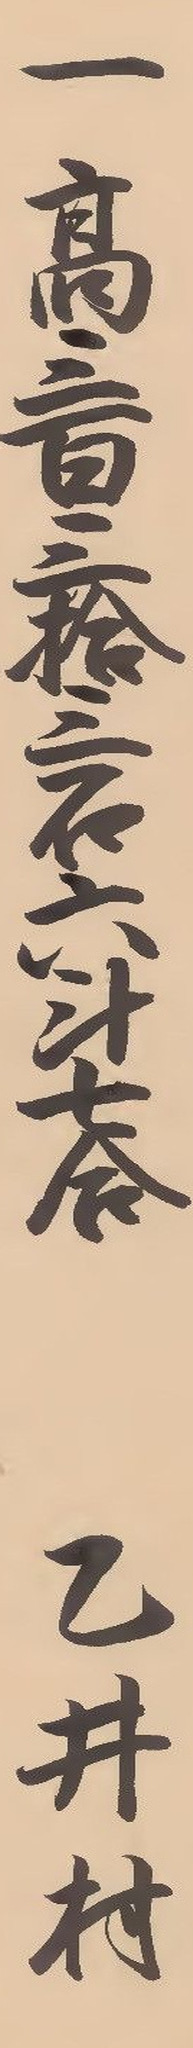一高三百三拾三石六斗七合乙井村
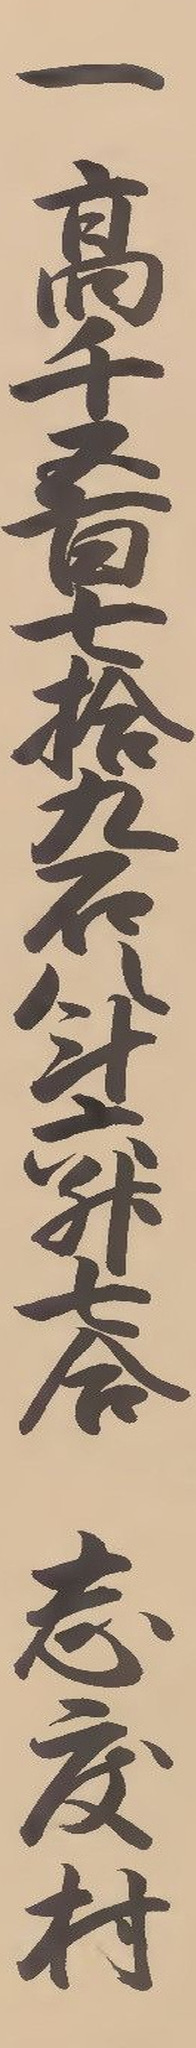一高千五百七拾九石八斗六升七合志度村
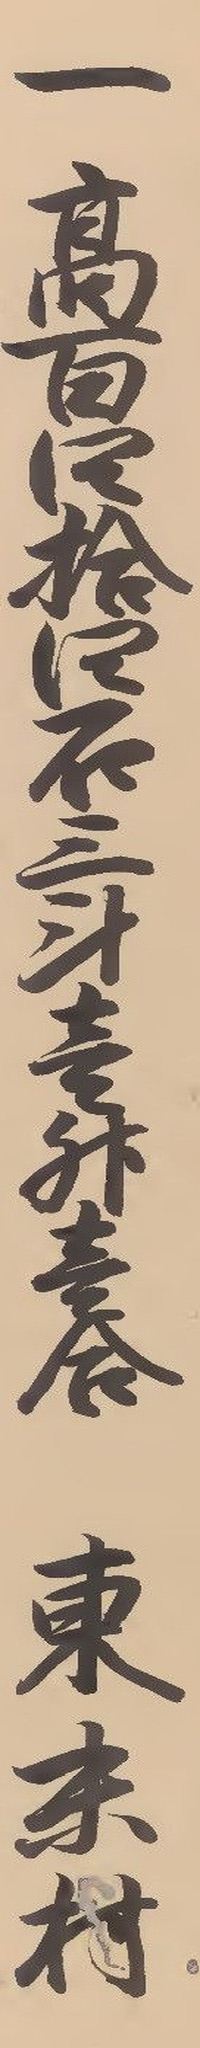一高百四拾四石三斗壱升壱合東末村
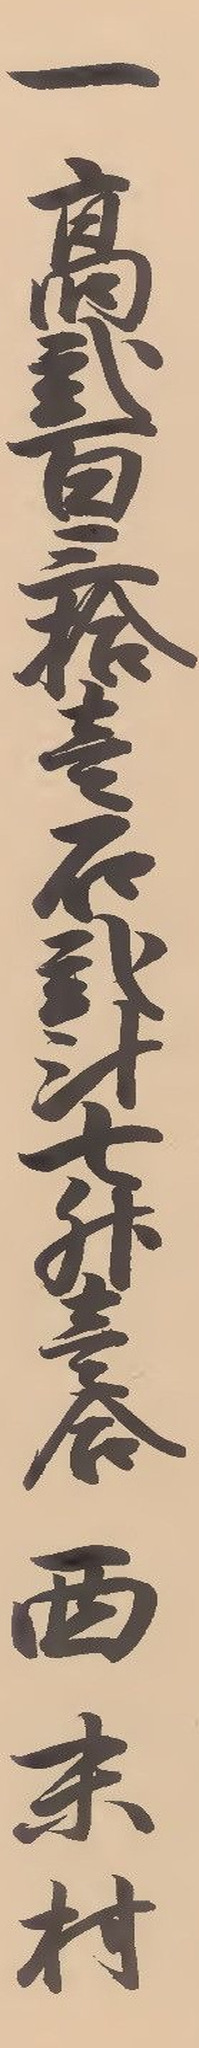一高弐百三拾壱石弐斗七升壱合西末村
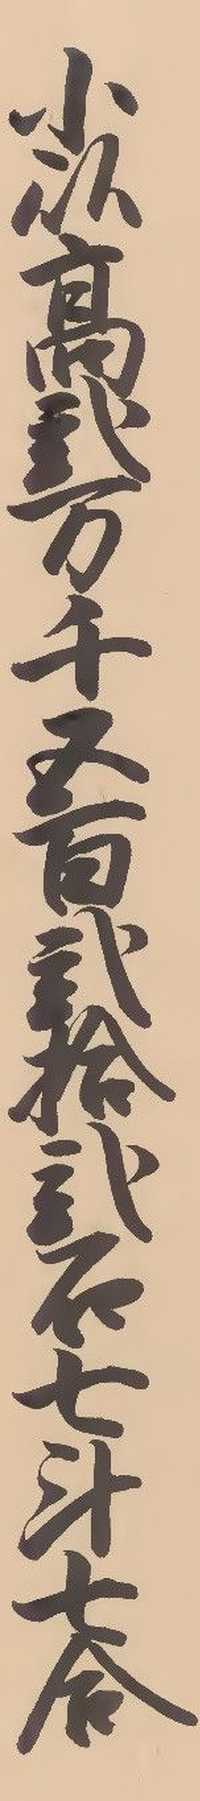小以高弐万千五百弐拾弐石七斗七合

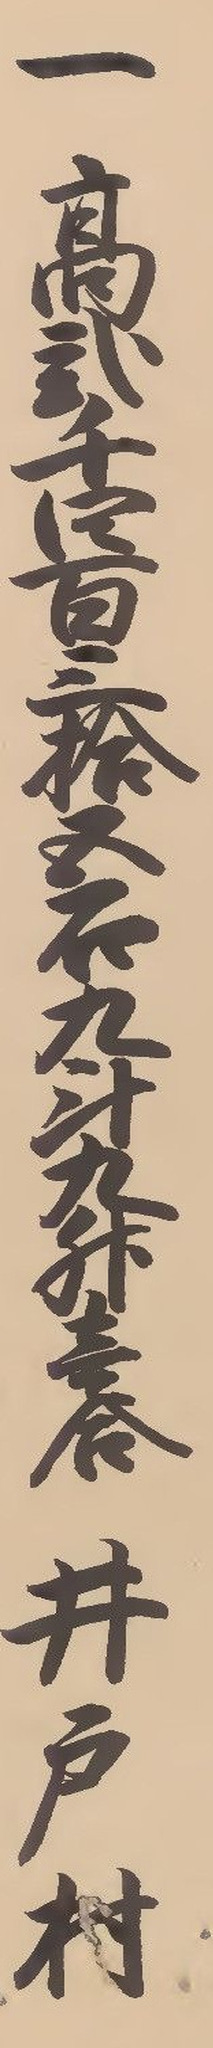一高弐千四百三拾五石九斗九升壱合井戸村
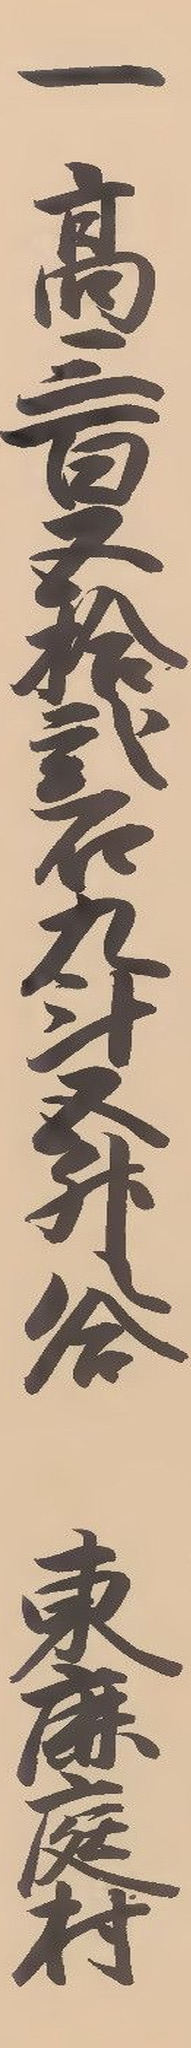一高三百五拾弐石九斗五升八合東鹿庭村
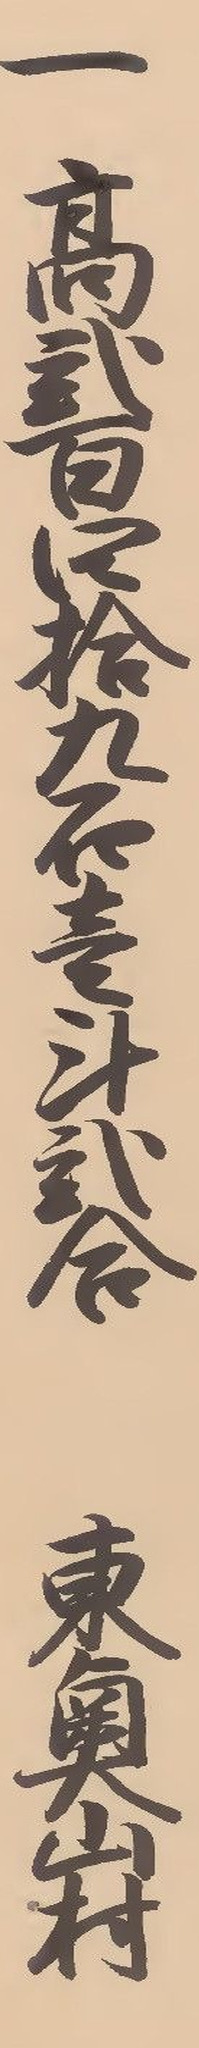一高弐百四拾九石壱斗弐合東奥山村
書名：讃岐国郷帳
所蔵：国立公文書館 National Archives of Japan
